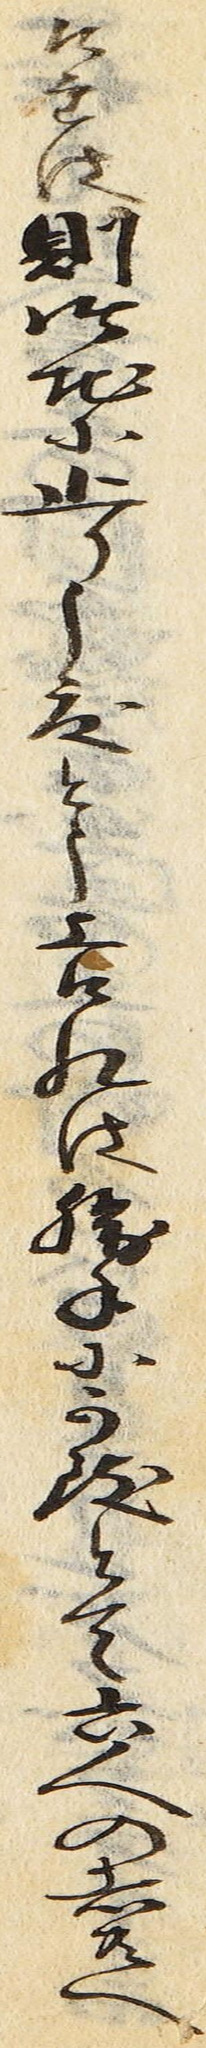けれは則此地に止り申し度と申し上けれは勝手に可致とて六人の者共へ
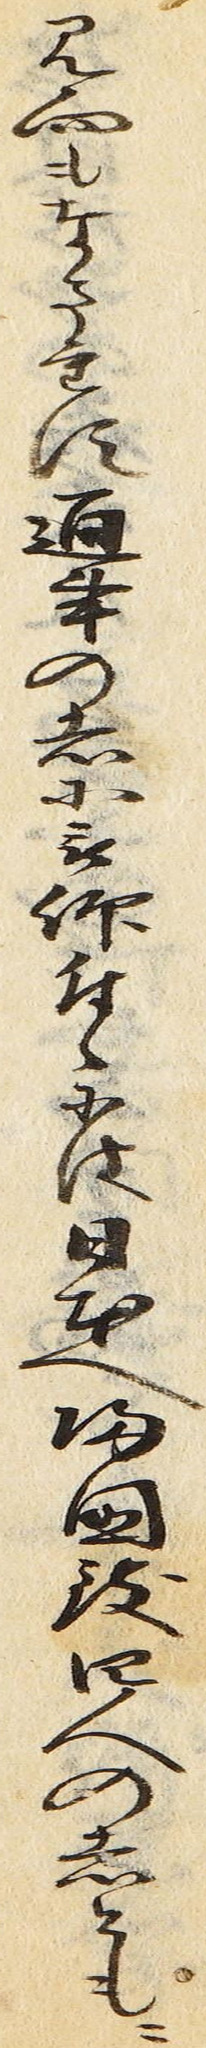見向もなされす通事の者に被仰付候には日本へ帰国致四人の者ともに
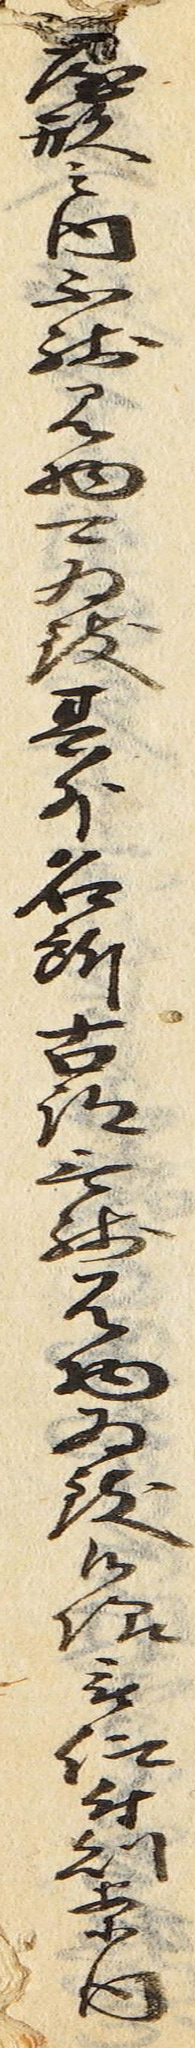屋形の内不残見物可為致其外名所古跡無残見物為致候様被仰付則案内
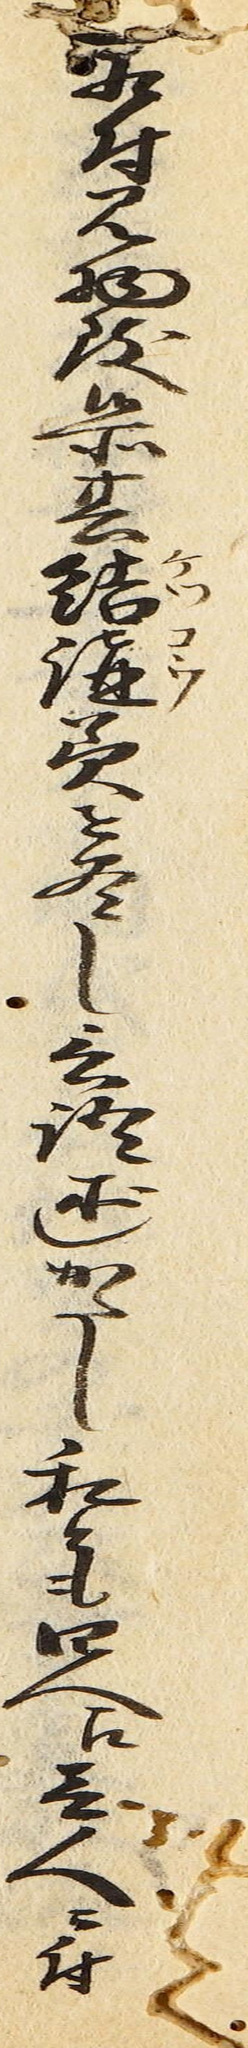一右付見物致候所其結構美を尽し言語述かたし私とも四人え壱人に付
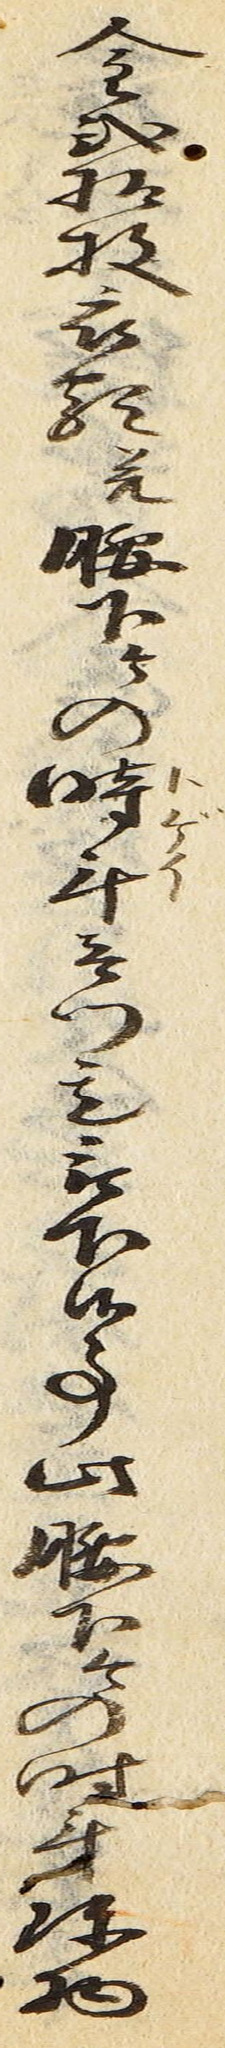金弐拾枚衣類并腰下ヶの都計壱つ置被下候事此腰下ヶの都計珍物
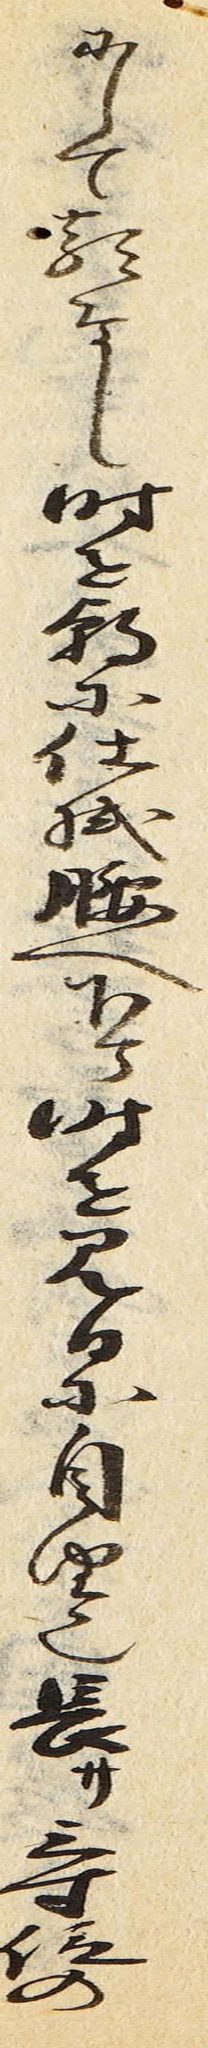にして類なし時を朝に仕掛腰へ下ヶ時を見るに自由也長さ三寸位の
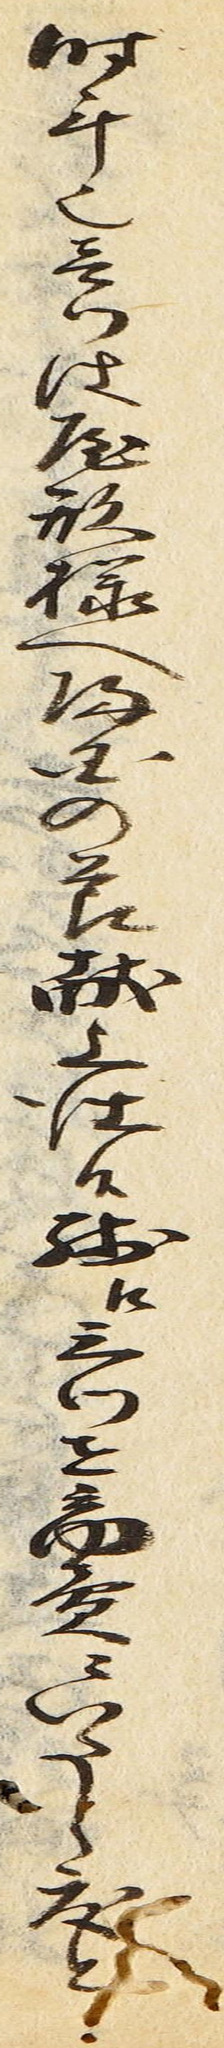都計也壱つは屋形様へ帰国の節献上仕候残る三つを商売にいたし度と
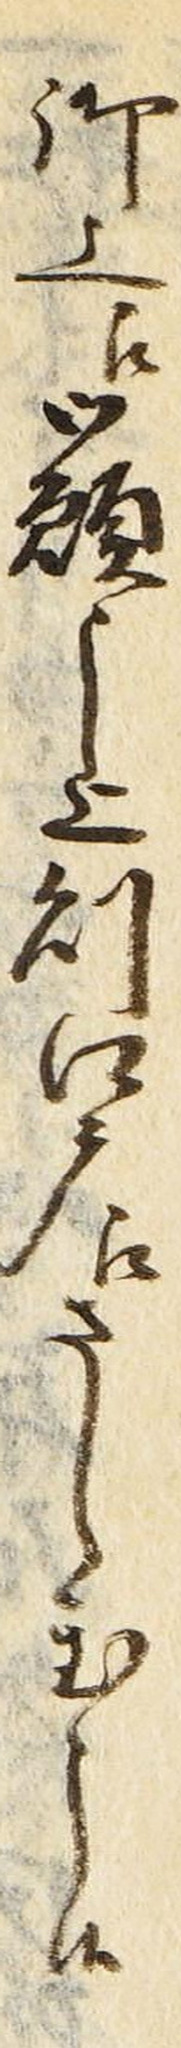御上え御願申上則江戸えさし置申し候
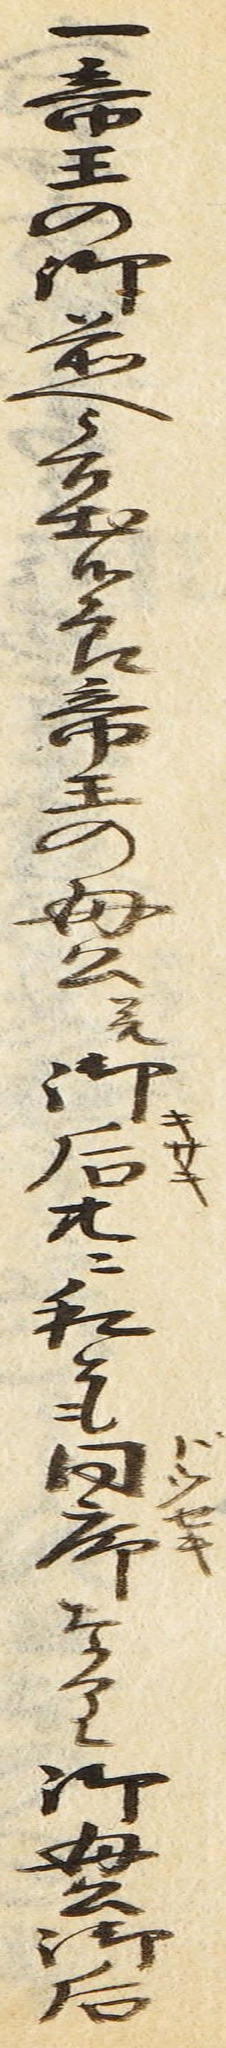一帝王の御前へ被召出候節帝王の母公并御后共に私とも同席なり御母公御后
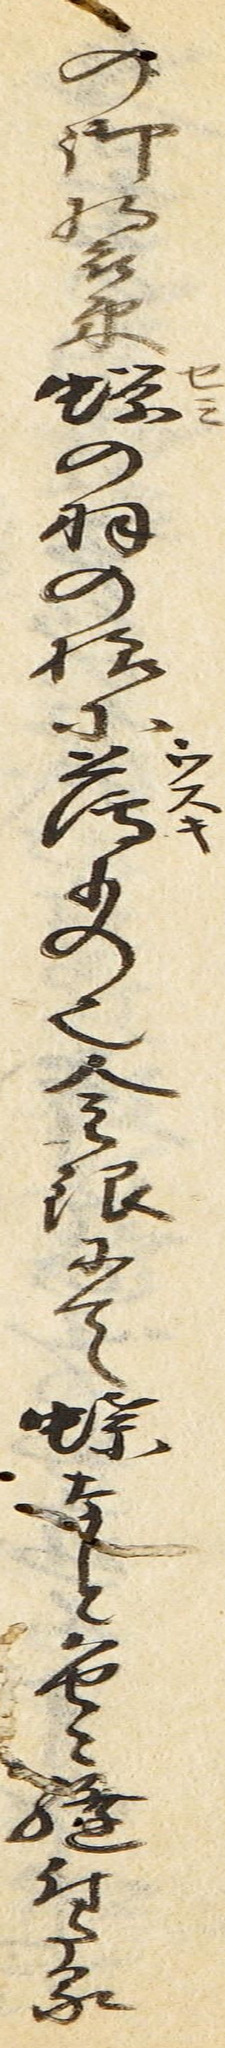の御装束蝉の羽の様に薄もの也金銀にて蝶なと色々縫付たる
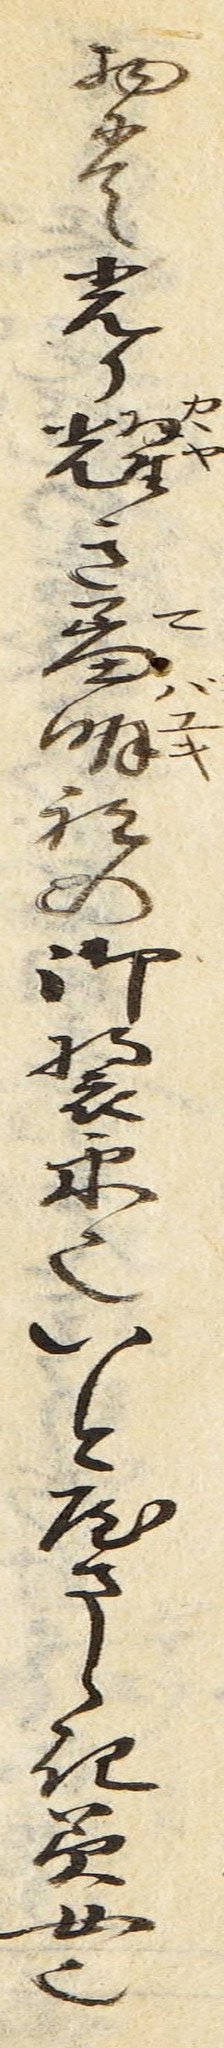物にて光り耀き羞明程の御装束也いとやさしき美女也
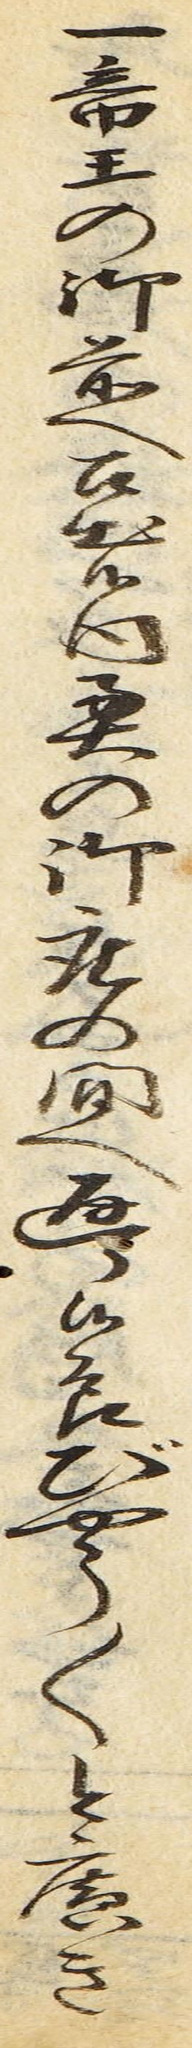一帝王の御前へ召出候内奥の御座の間へ通り候節びやう〳〵と広き
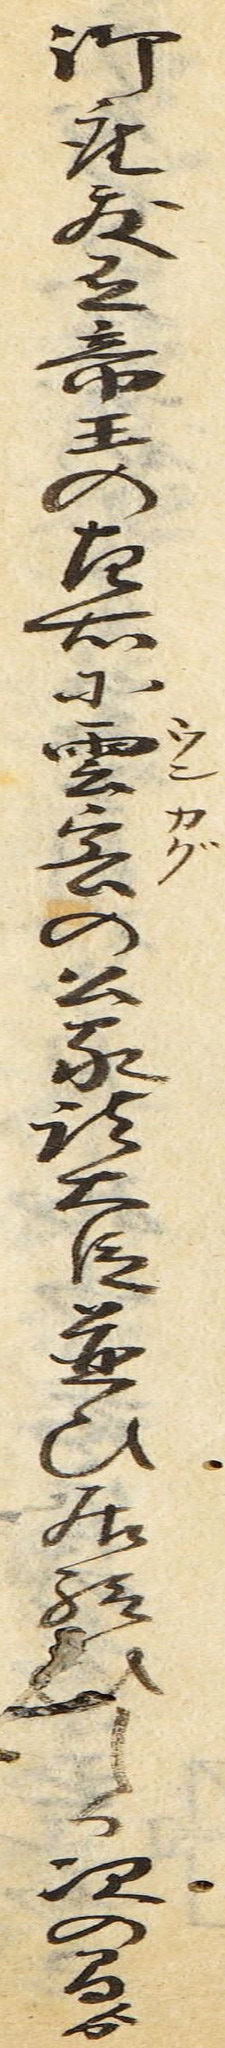御座敷有帝王の左右に雲客の公家諸大臣並ひ居給ひしか次の間ゟ

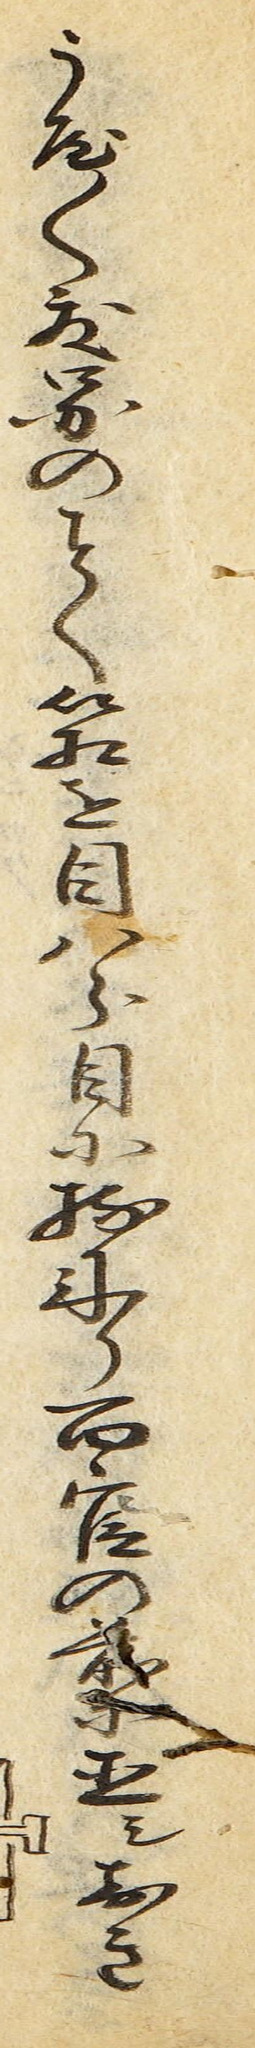うや〳〵敷図のことく箱を目八分目に持来り百官の前に直しおき
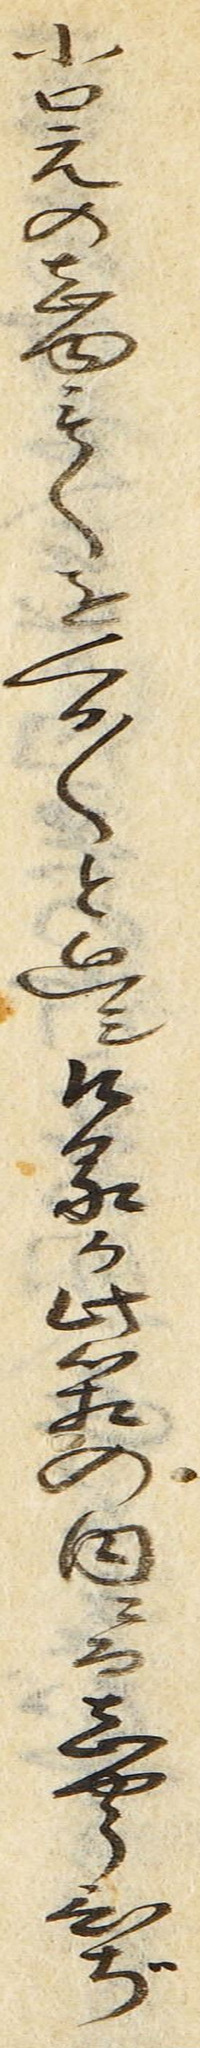小口元のしゆもくをくる〳〵と廻しけるか此箱の内に而しやうひぢ
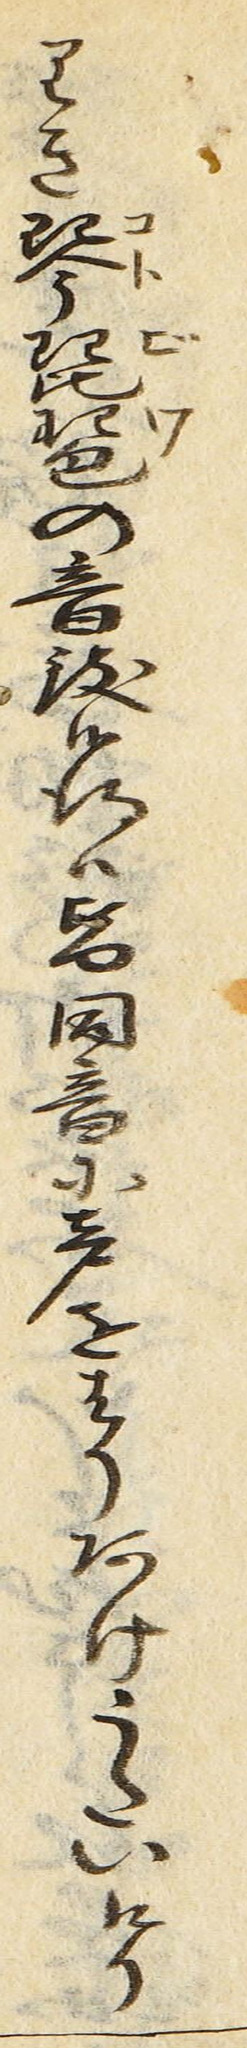りき琴琵琶の音致候得は皆同音に声をはりあけうたいけり
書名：外国漂流記
